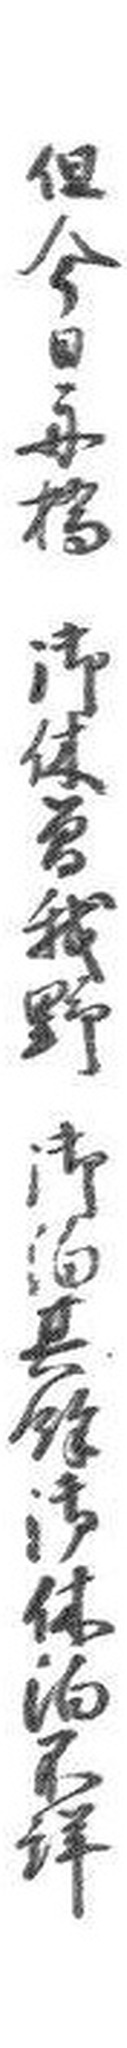但今日舟橋御休曾我野御泊其余御休泊不詳
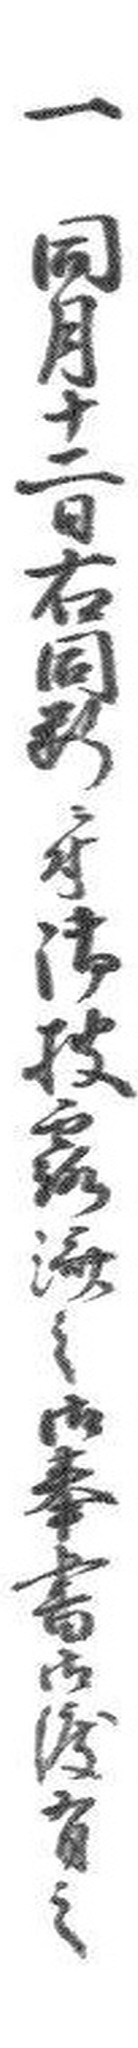一同月十二日右同断ニ付御披露済之御奉書御渡有之
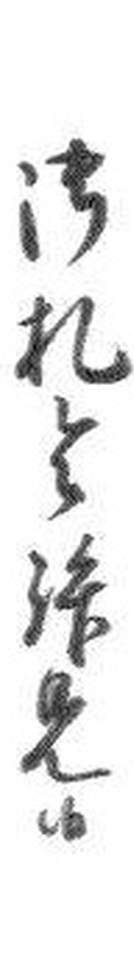御札令拝見候
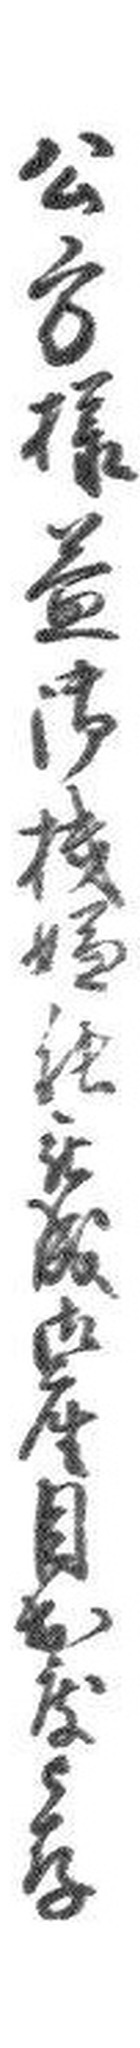公方様益御機嫌能被成御座目出度被存
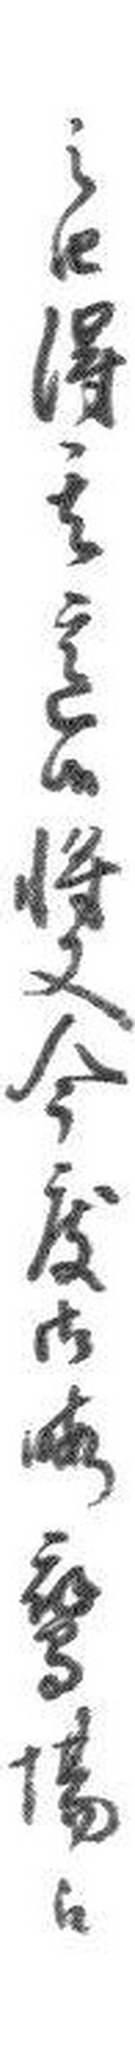之由得其意候将又今度御暇鷹場江
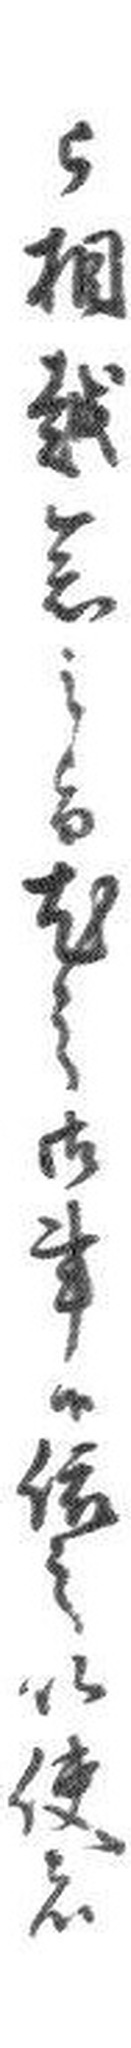被相越念之旨尤之御事候依之御使者
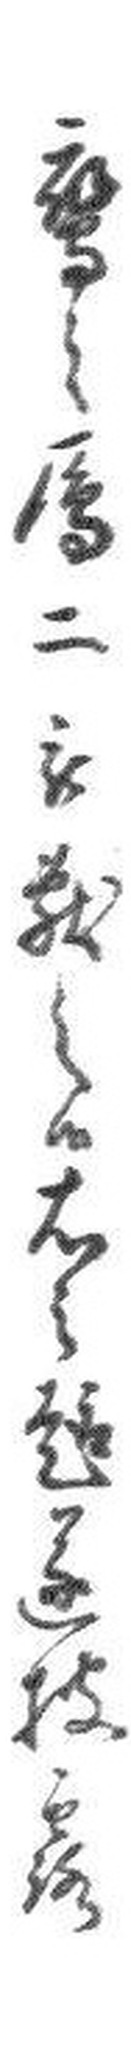鷹之雁二被献之候右之趣遂披露
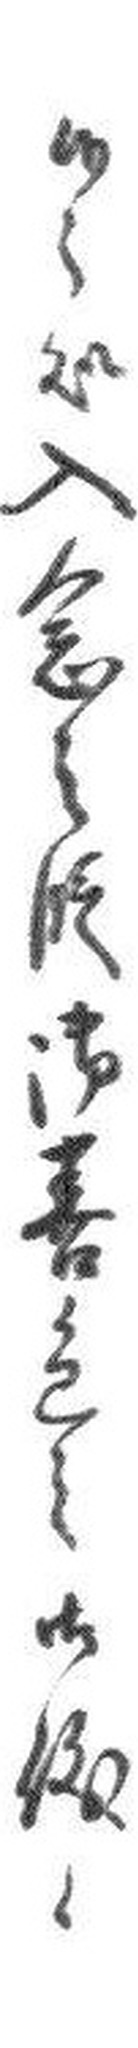候之処入念之段御喜色之御儀候

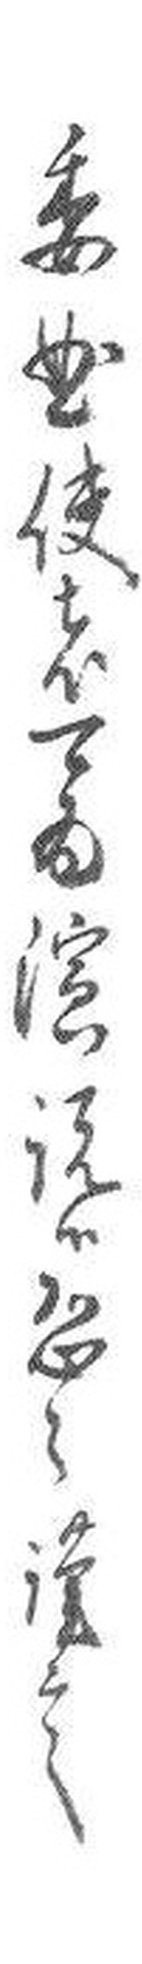委曲使者可為演説候恐々謹言
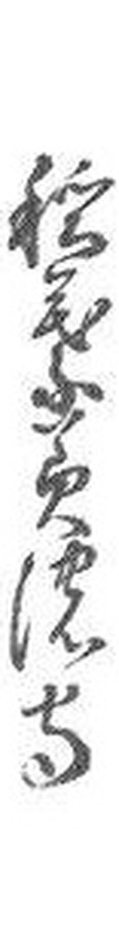稲葉美濃守
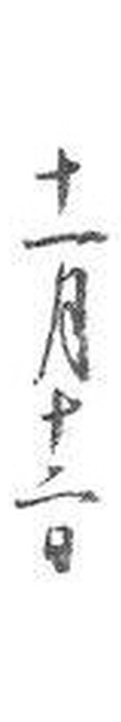一十一月十七日
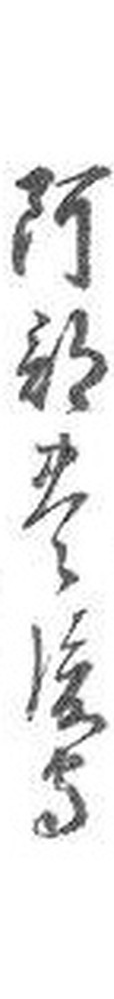阿部豊後守
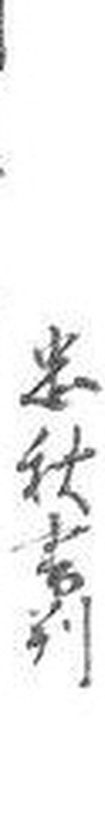忠秋書判
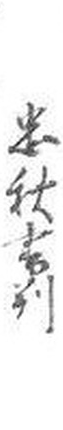忠秋書判
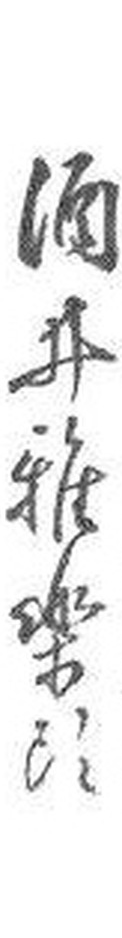酒井雅樂頭
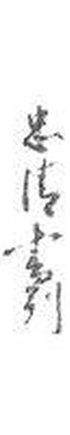忠清書判
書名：家譜 六 光通公 従万治三年到寛文三年
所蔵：福井県文書館 Fukui Prefectural Archives
